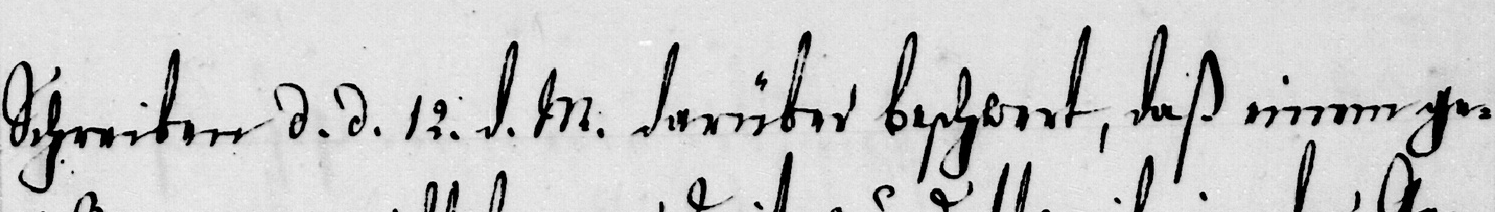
Schreiben d. d. 12. d. M. darüber beschwert, daß einem ge¬
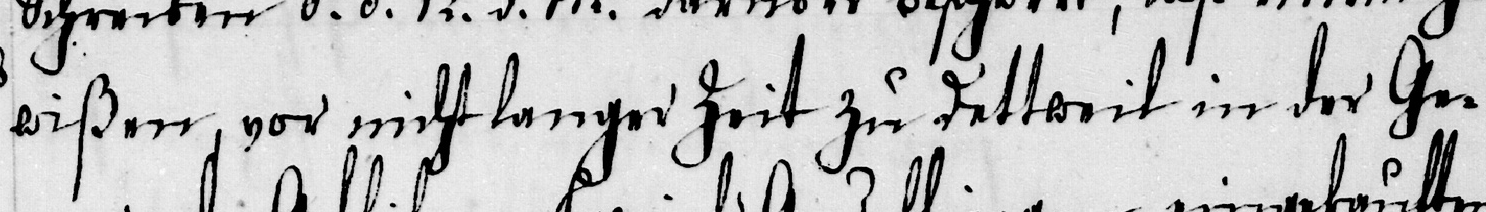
wißen, vor nicht langer Zeit zu Dettweil in der Ge¬
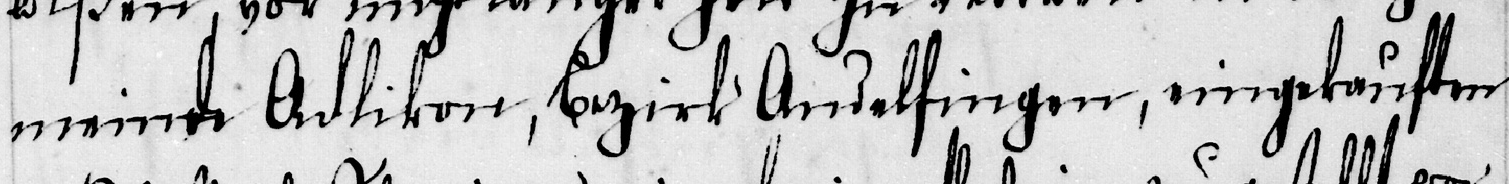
meinde Adlikon, Bezirk Andelfingen, eingekauften
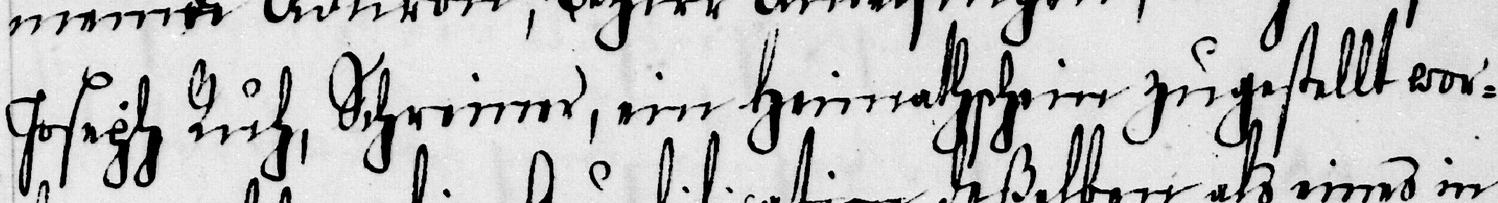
Joseph Ruch, Schreiner, ein Heimathschein zugestellt wor¬
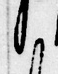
s¬
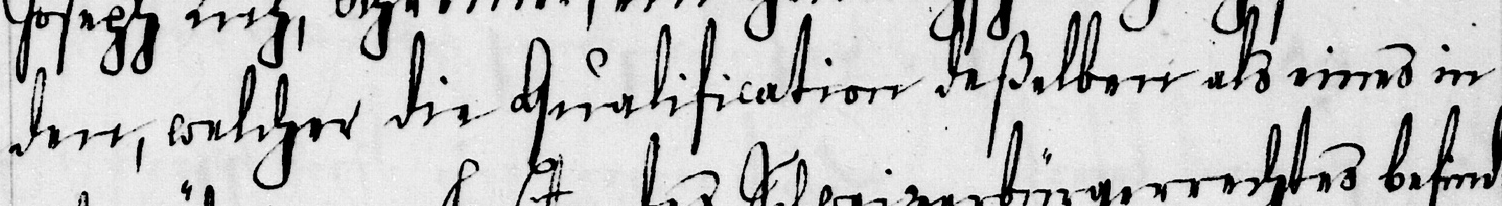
den, welcher die Qualification deßelben als eines in
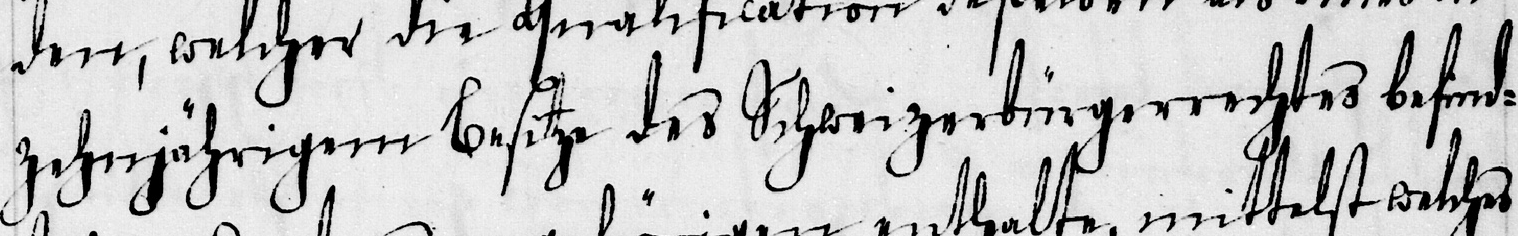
zehnjährigem Besitze des Schweizerbürgerrechts befind¬
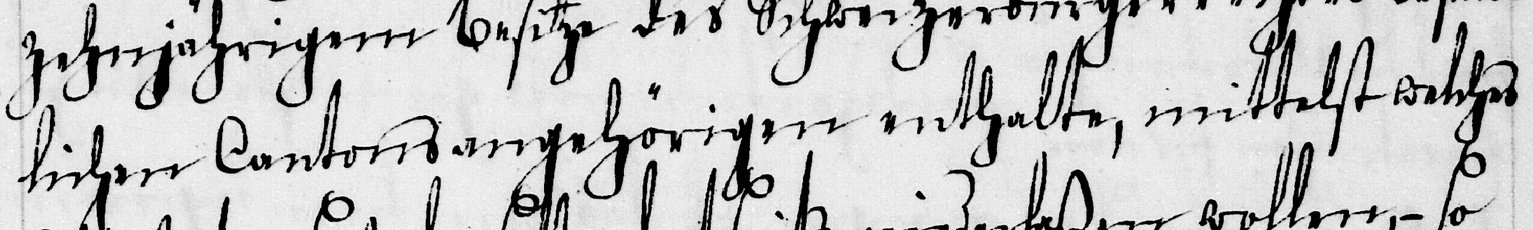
lichen Cantonsangehörigen enthalte, mittelst welches
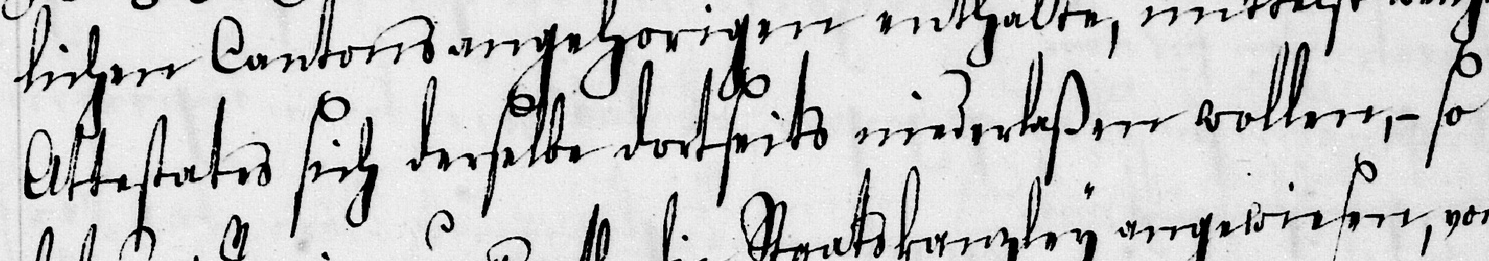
testates sich derselbe dortseits niederlaßen wollen, – so
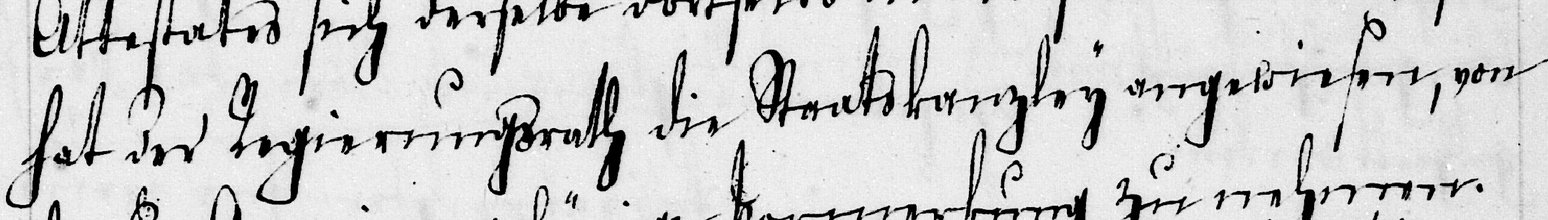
hat der Regierungsrath die Staatskanzley angewiesen, von
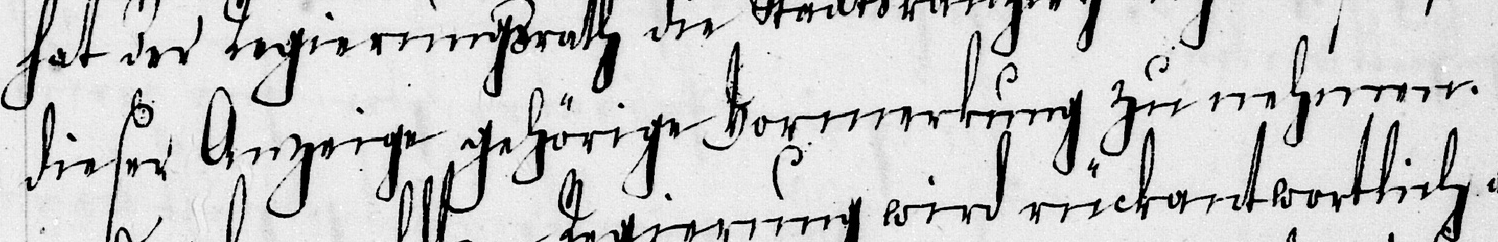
dieser Anzeige gehörige Vormerkung zu nehmen.
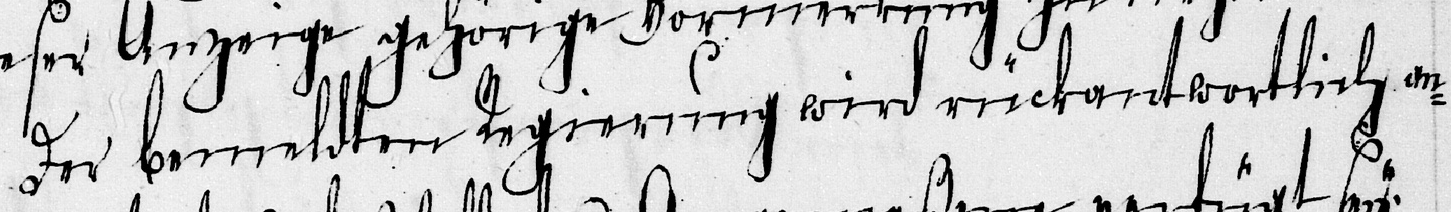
Der bemeldten Regierung wird rückantwortlich an¬
